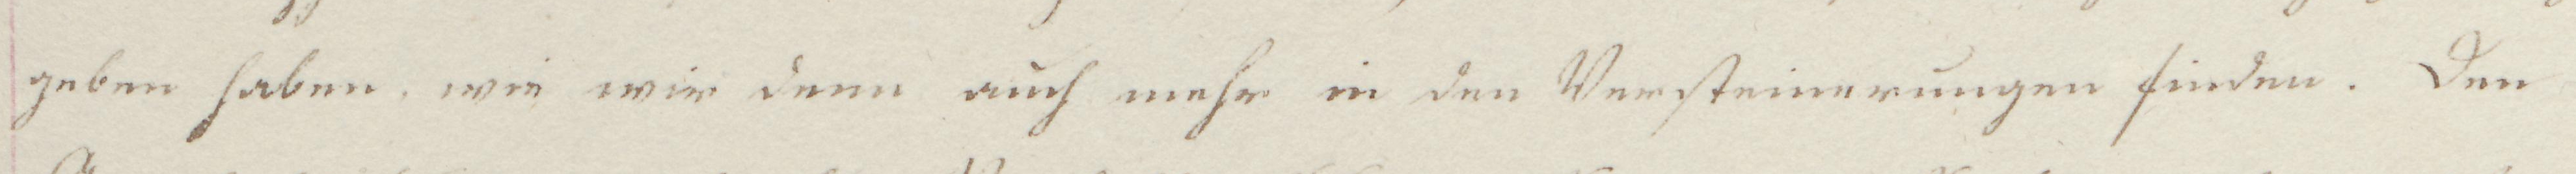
geben haben, wie wir denn auch mehr in den Versteinerungen finden. Den
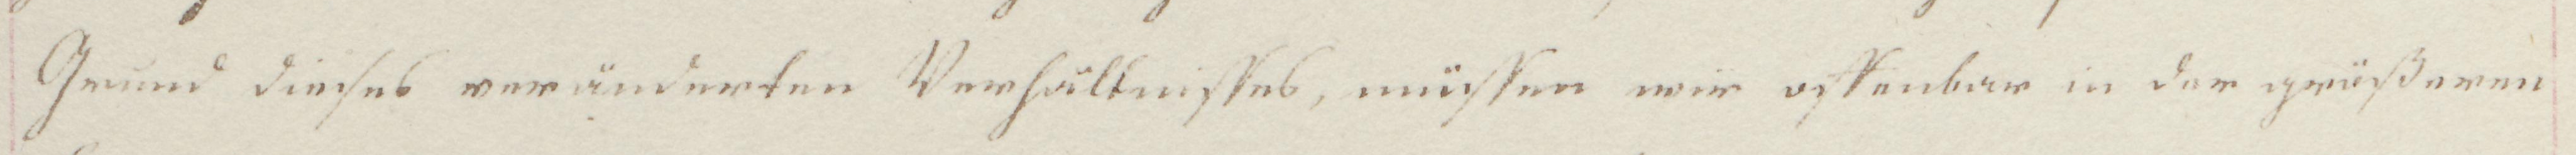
Grund dieses veränderten Verhältnisses, müssen wir offenbar in der größeren
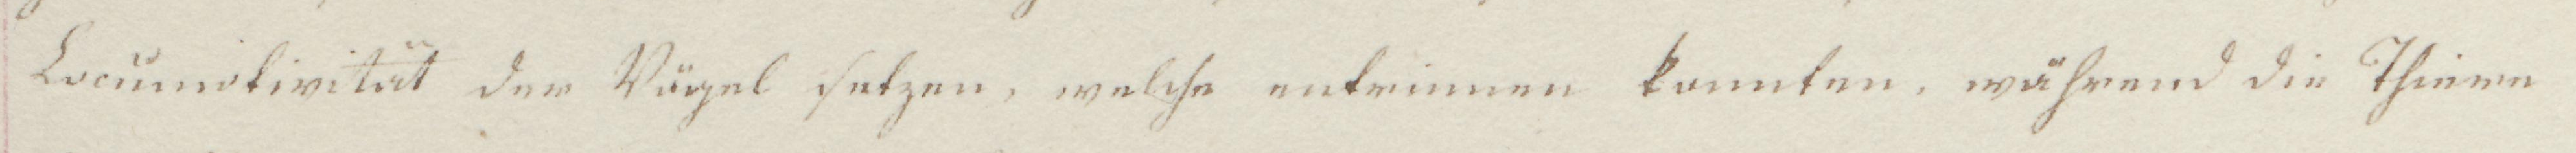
Locumotivität der Vögel setzen, welche entrinnen konnten, während die Thiere
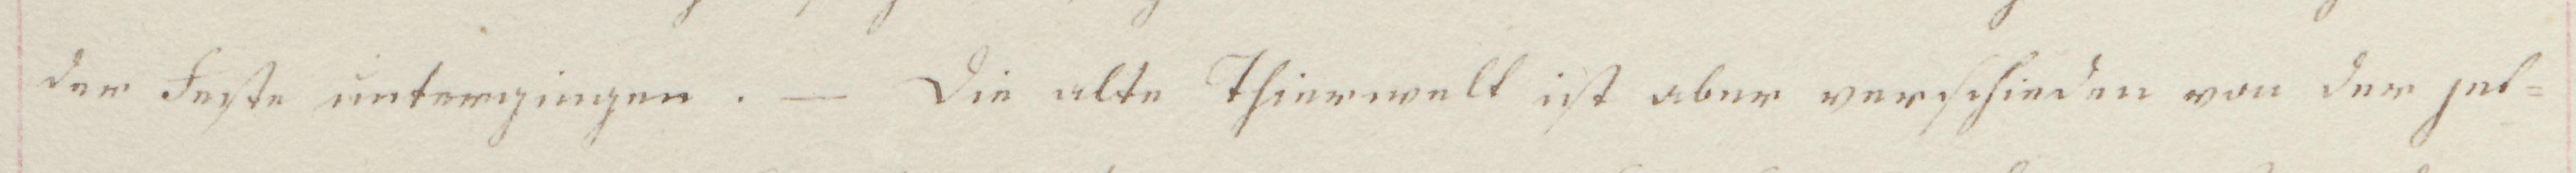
der Feste untergingen. – Die alte Thierwelt ist aber verschieden von der jet-
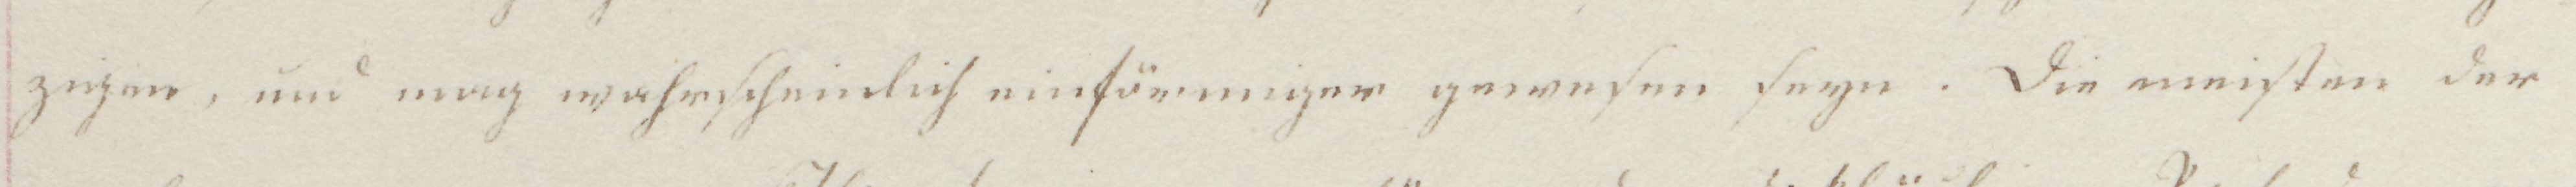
zigen, und mag wahrscheinlich einförmiger gewesen seyn. Die meisten der
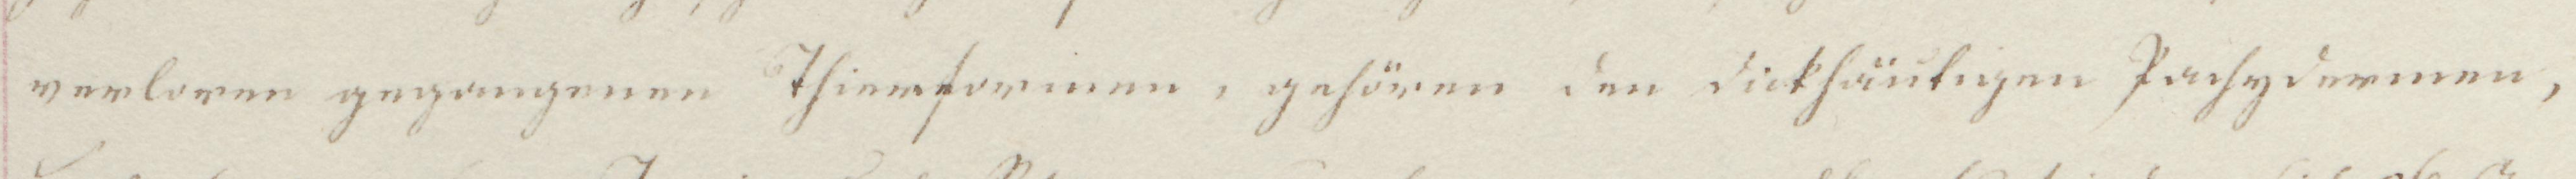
verloren gegangenen Thierformen, gehören den dickhäutigen Pachydermen,
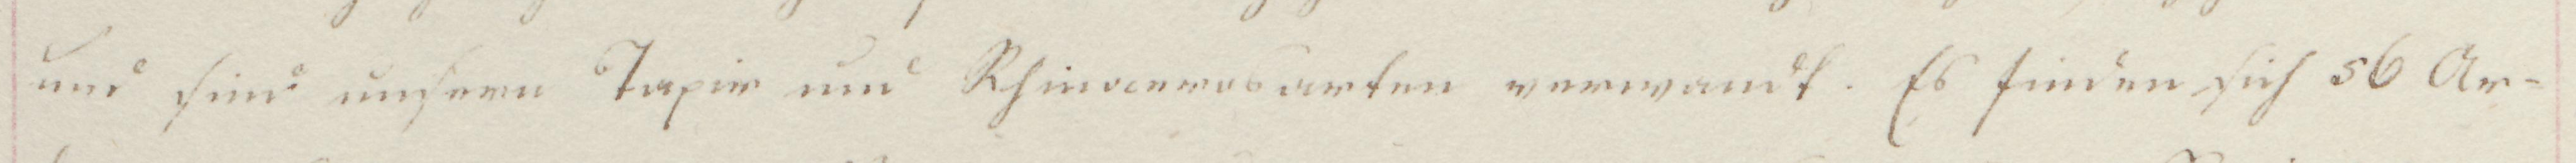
und sind unsern Tapir und Rhinocerosarten verwandt. Es finden sich 56 Ar-
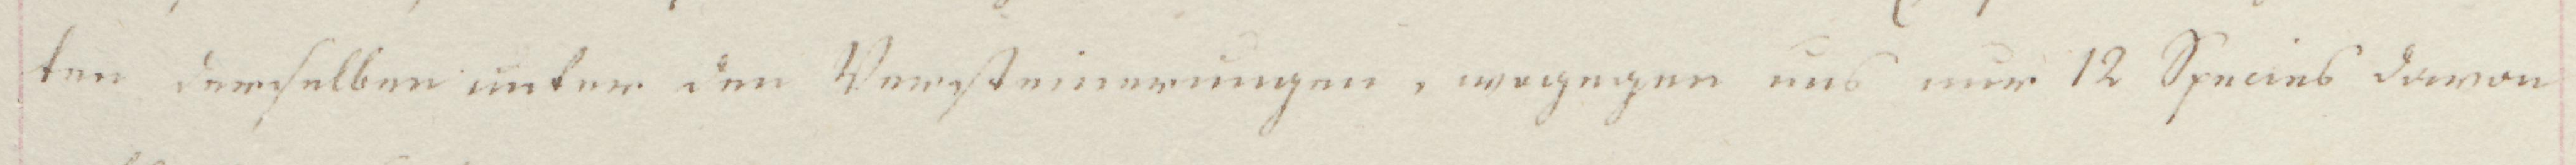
ten derselben unter den Versteinerungen, wogegen uns nur 12 Species davon
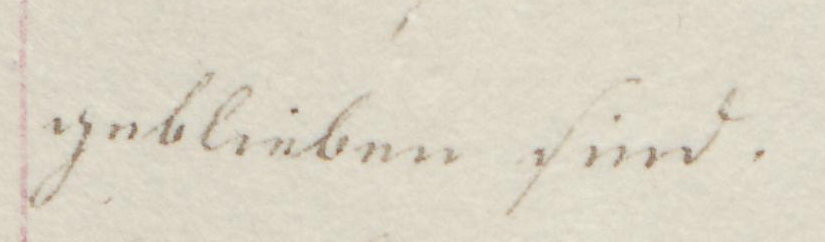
geblieben sind.
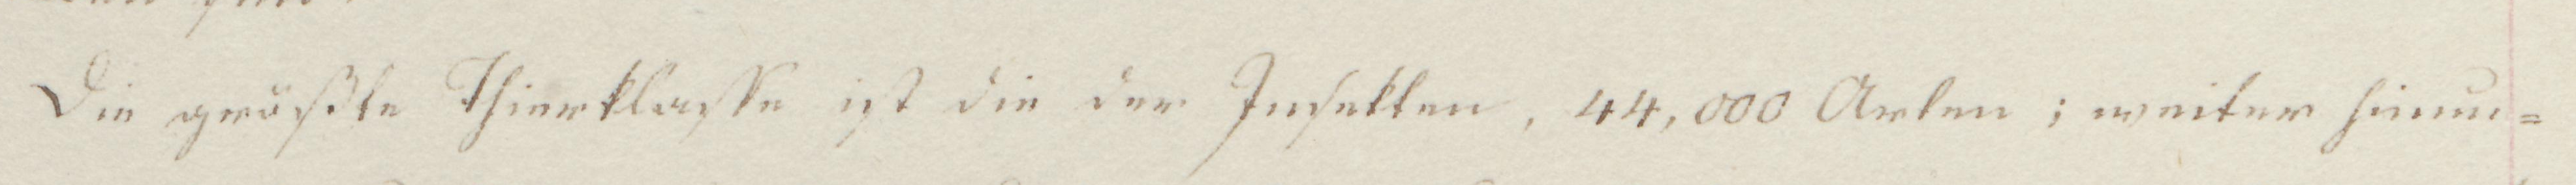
Die größte Thierklasse ist die der Insekten, 44,000 Arten; weiter hinun-
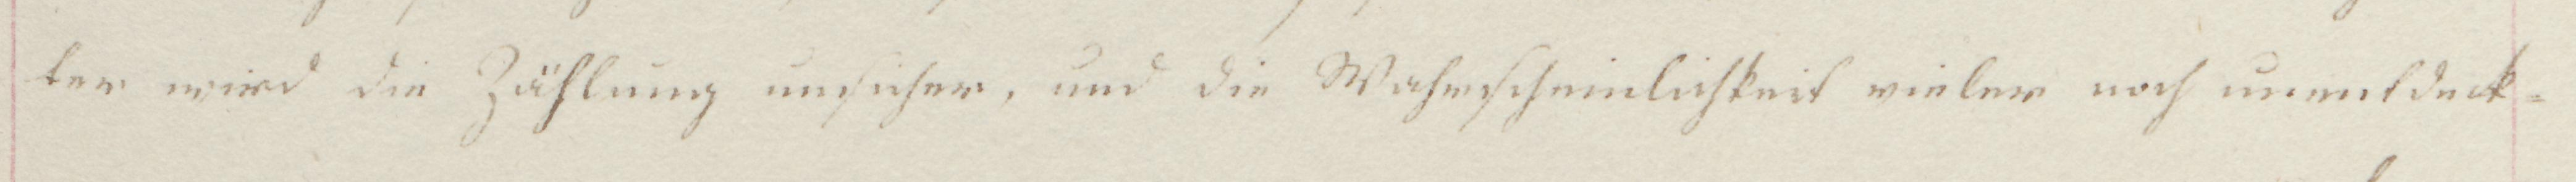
ter wird die Zählung unsicher, und die Wahrscheinlichkeit vieler noch unentdeck-
